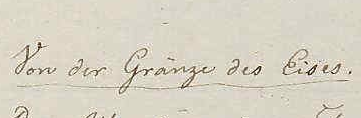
Von der Gränze des Eises.
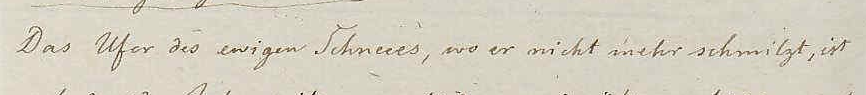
Das Ufer des ewigen Schneees, wo er nicht mehr schmilzt, ist
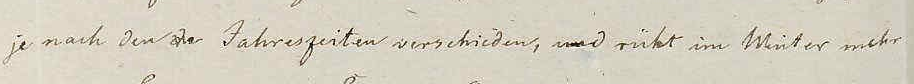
je nach den de Jahreszeiten verschieden, und rükt im Winter mehr
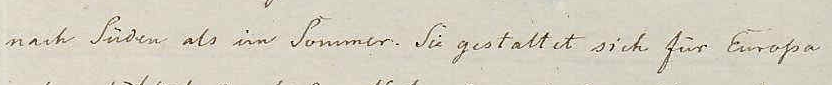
nach Süden als im Sommer. Sie gestaltet sich für Europa
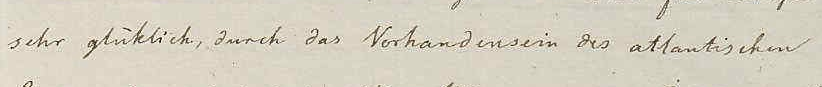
sehr glüklich, durch das Vorhandensein des atlantischen
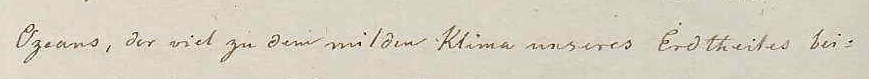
Ozeans, der viel zu dem milden Klima unseres Erdtheiles bei-
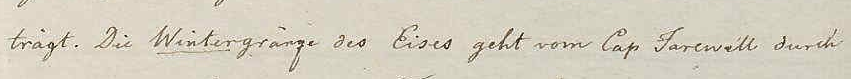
trägt. Die Wintergränze des Eises geht vom Cap Farewell durch
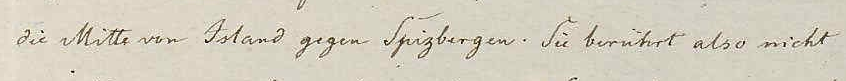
die Mitte von Island gegen Spizbergen. Sie berührt also nicht
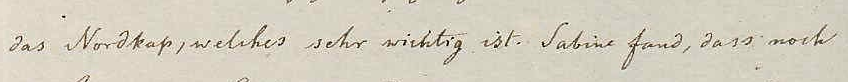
das Nordkap, welches sehr wichtig ist. Sabine fand, dass noch
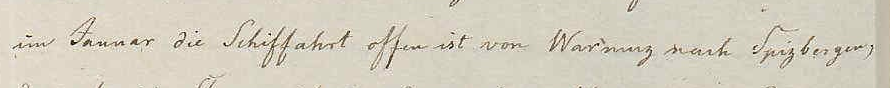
im Januar die Schiffahrt offen ist von Warnung nach Spizbergen,
